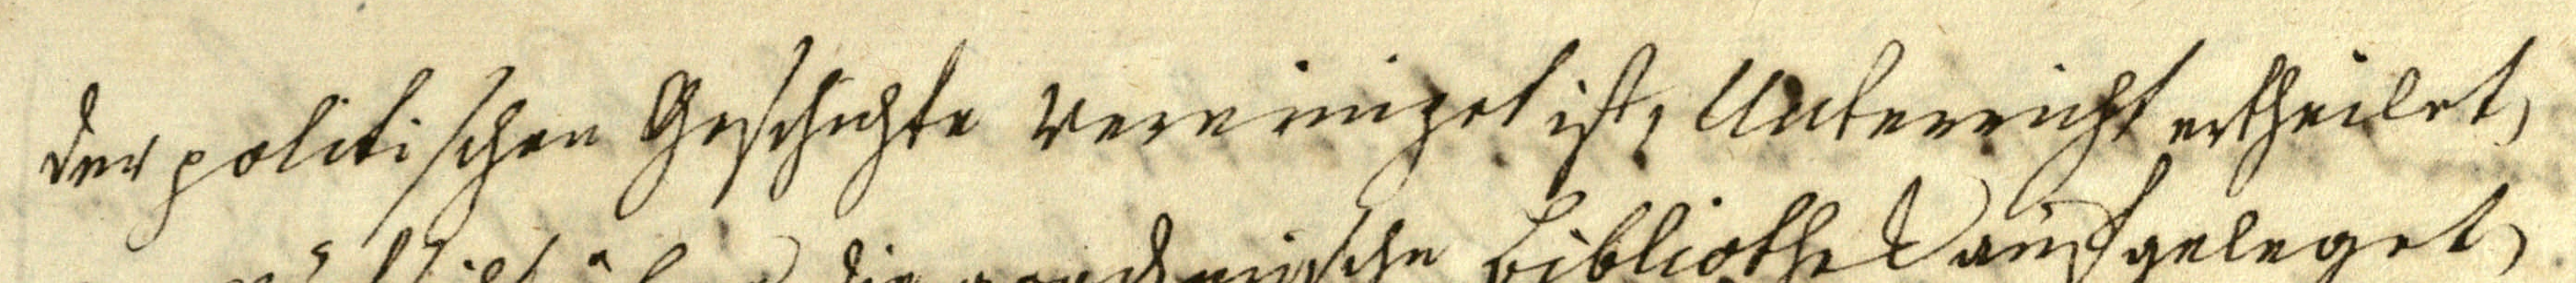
der politi schon Geschäfte vereinget ist, Unterricht ertheilet,
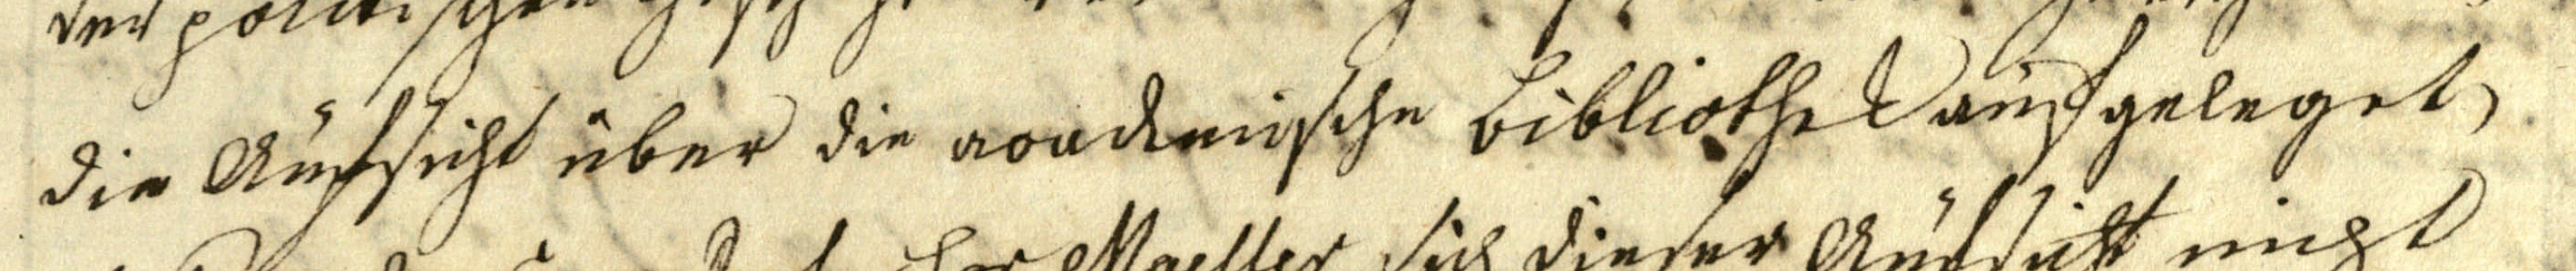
die Aufsicht über die academische Bibliothek aufgeleget,
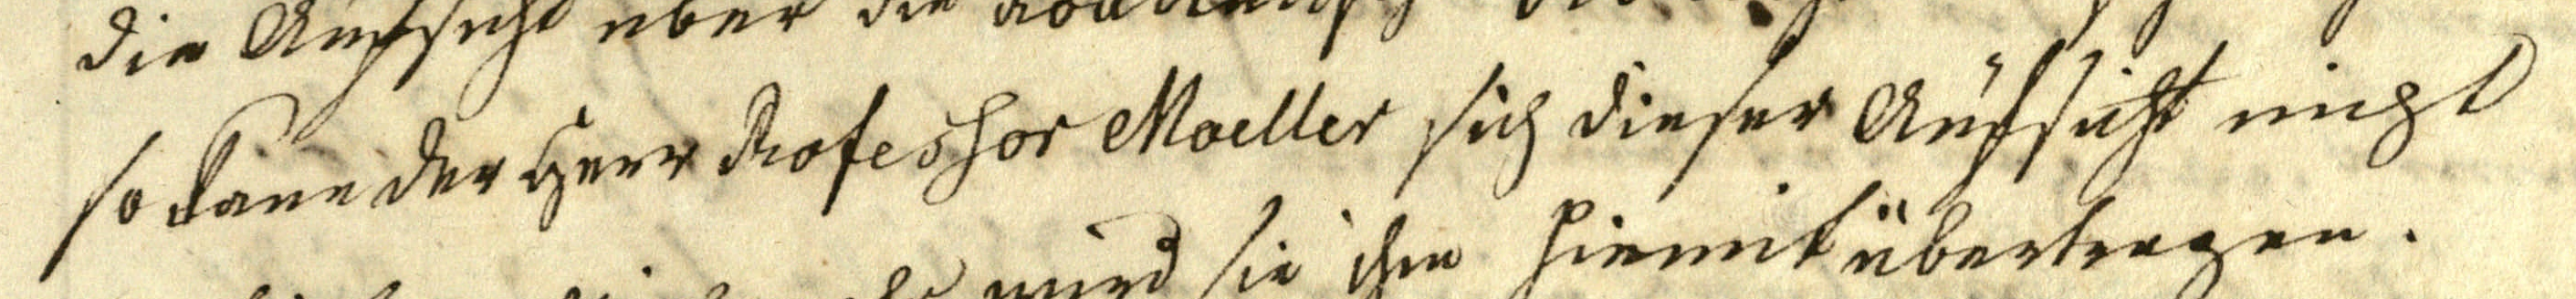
so kann der Herr Professor Möller sich dieser Aufsicht nicht
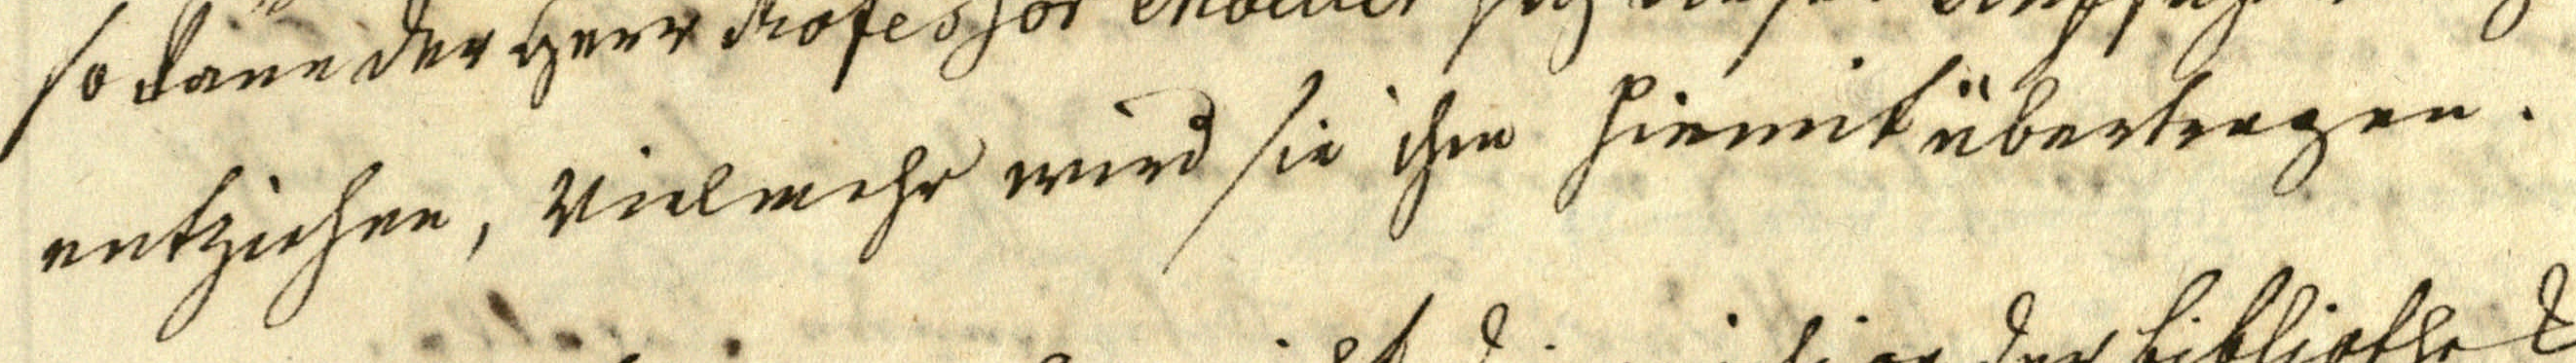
entziehen, vielmehr wird sie ihm hiemit übertragen.
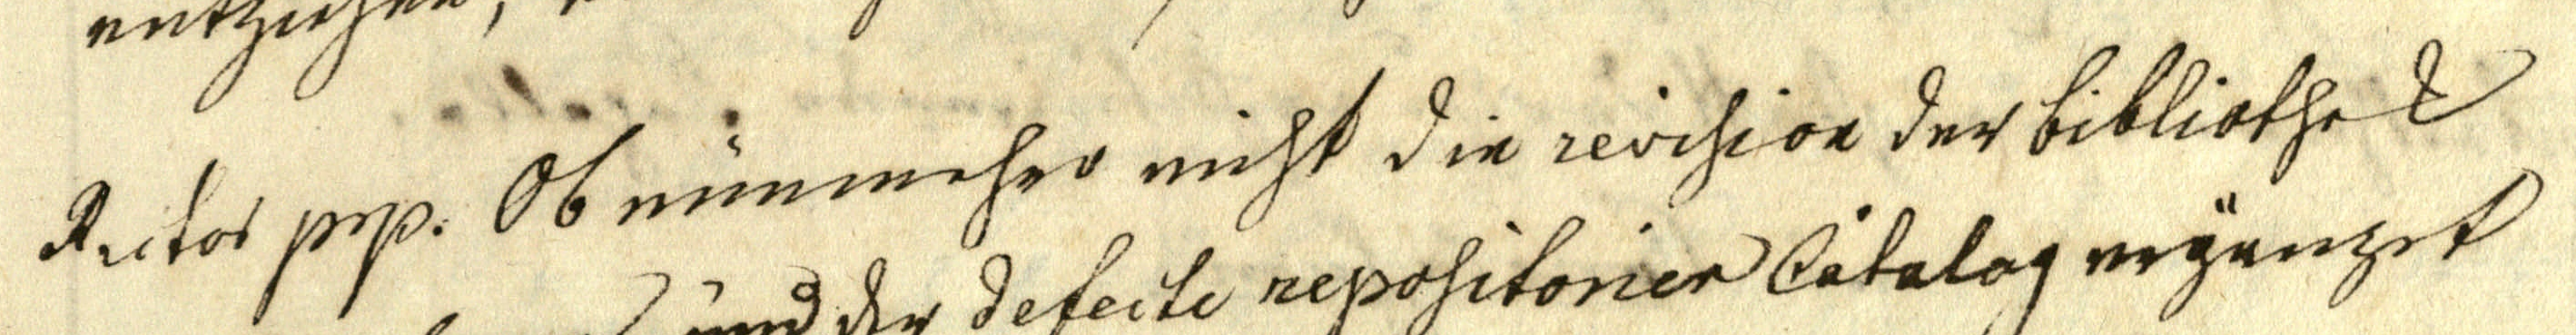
Rector per. Ob nunmehro nicht die rahion der Bibliothek
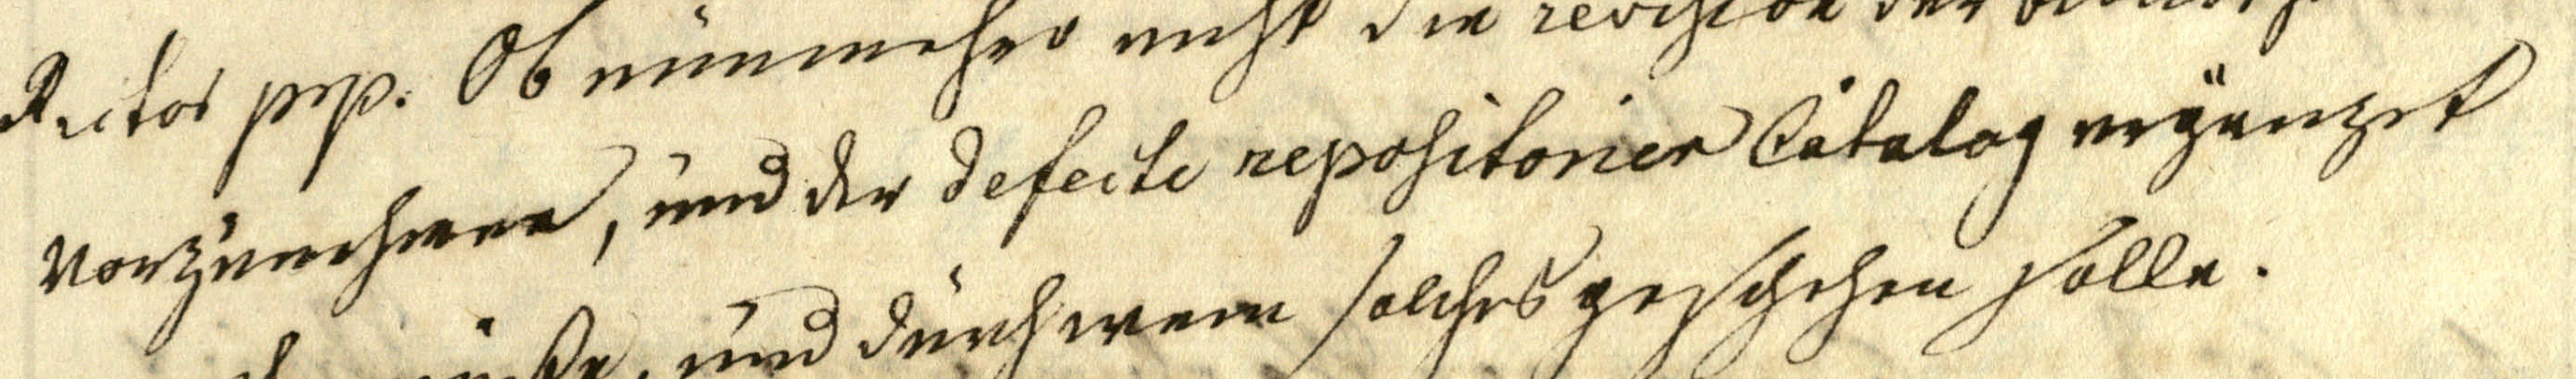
vorzunehmen, und der Defecte repositorien Catalog ergangene
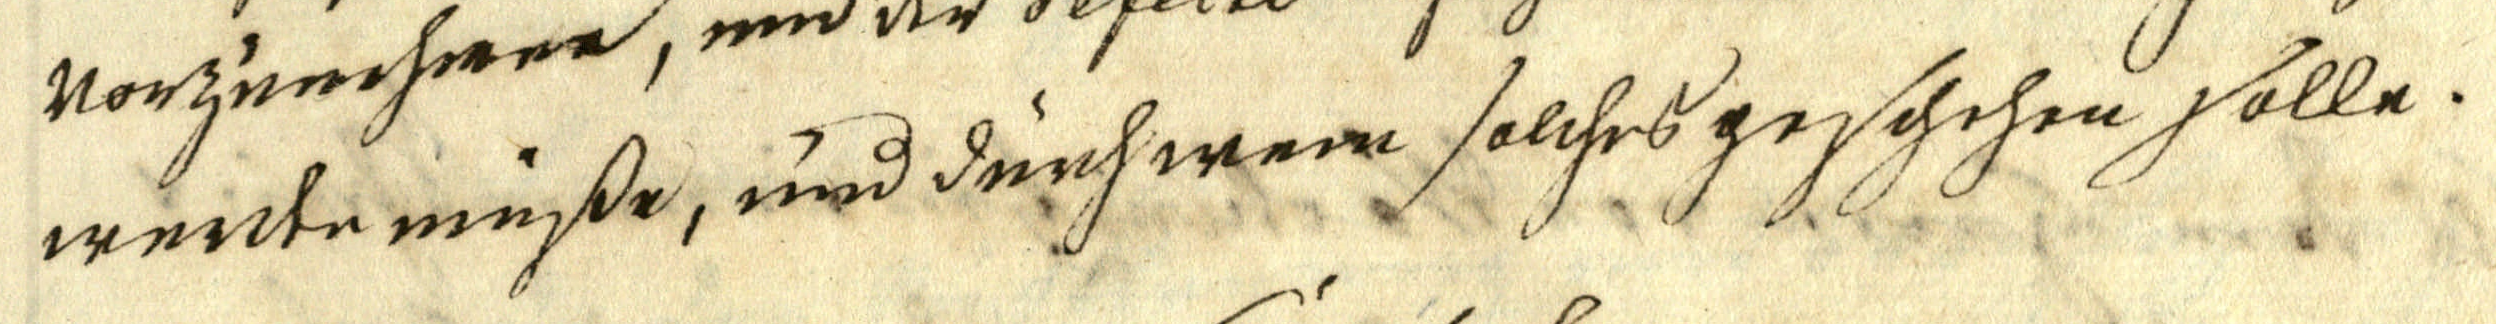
werden müßte, und durch werde solches geschehen solle.
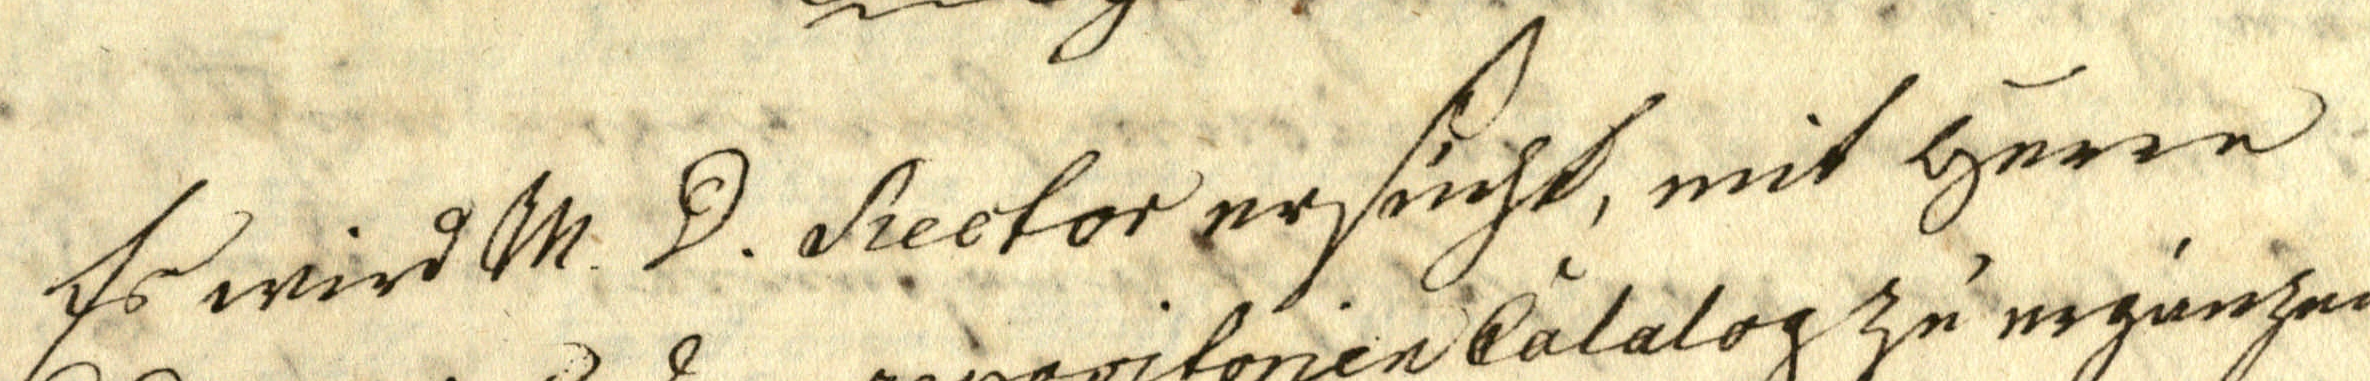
Er wird M. D. Rector ersucht, mit Herrn
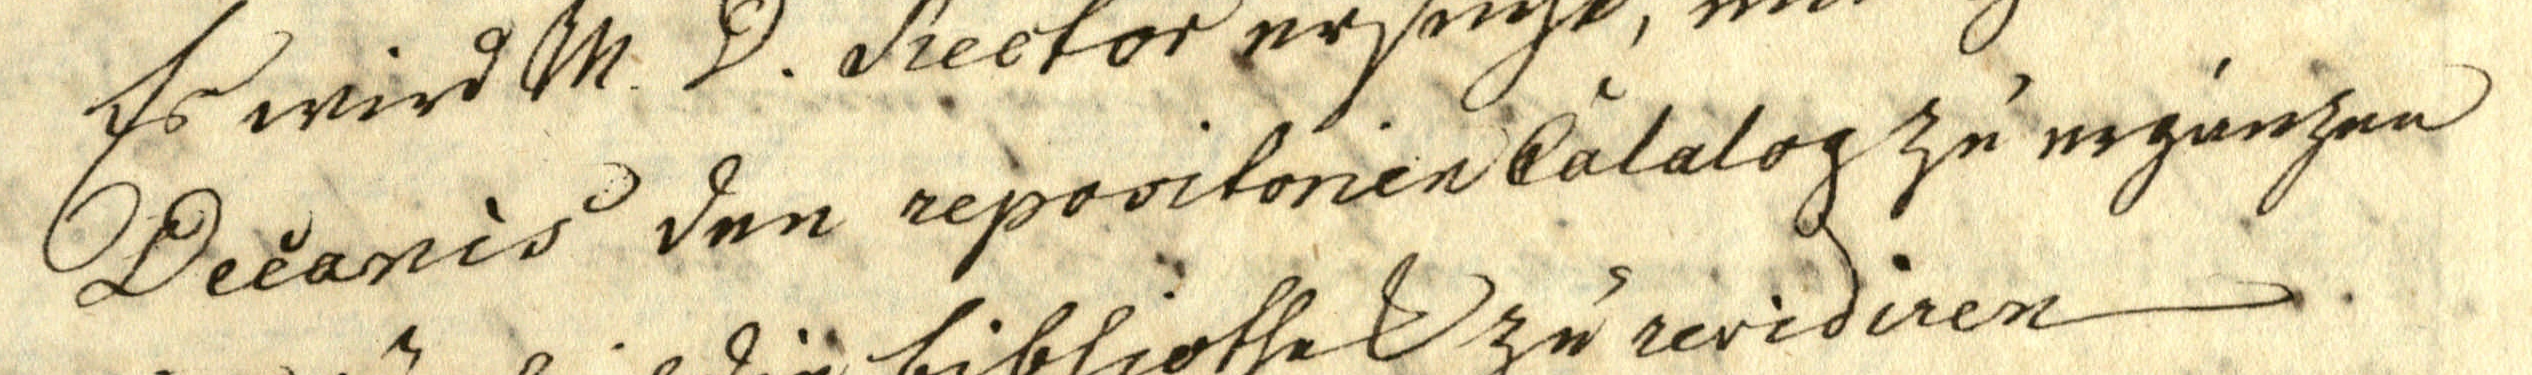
Decanis den repusrtoren Catalog zu ergangene
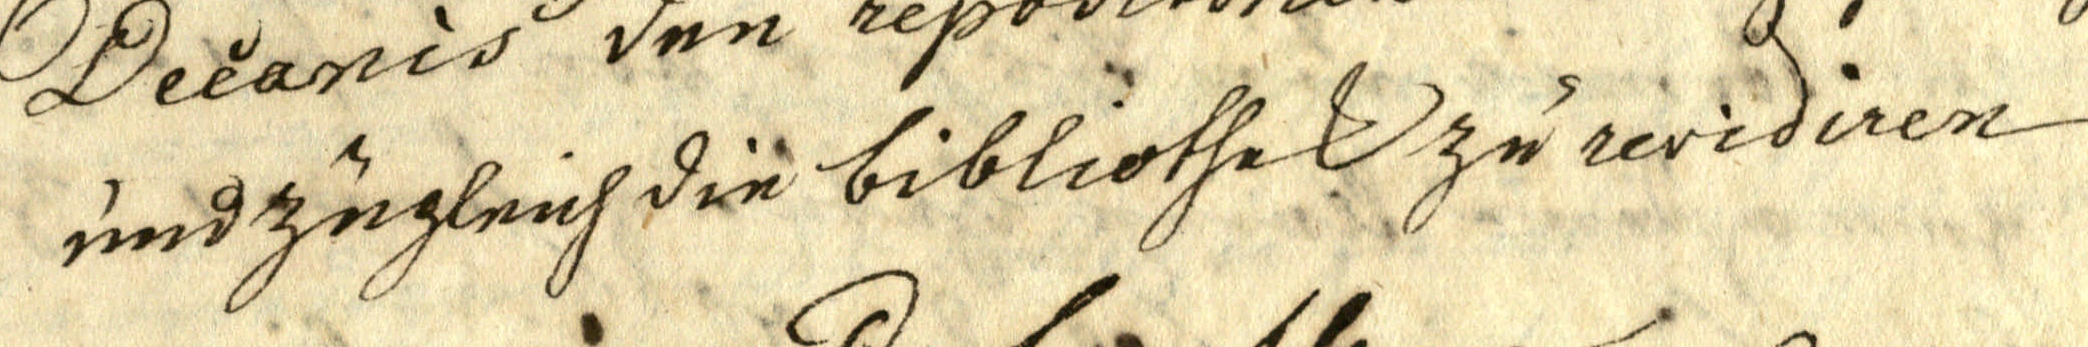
und zugleich die Bibliothek zu uridiren
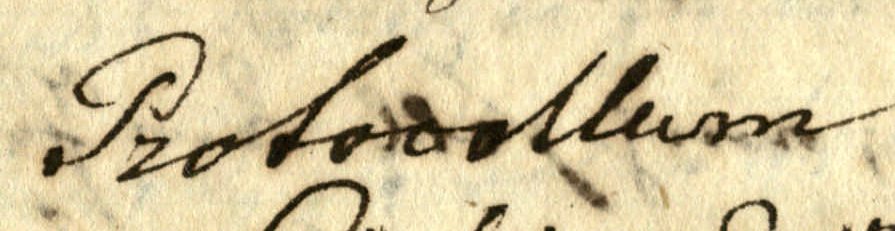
Protocollum
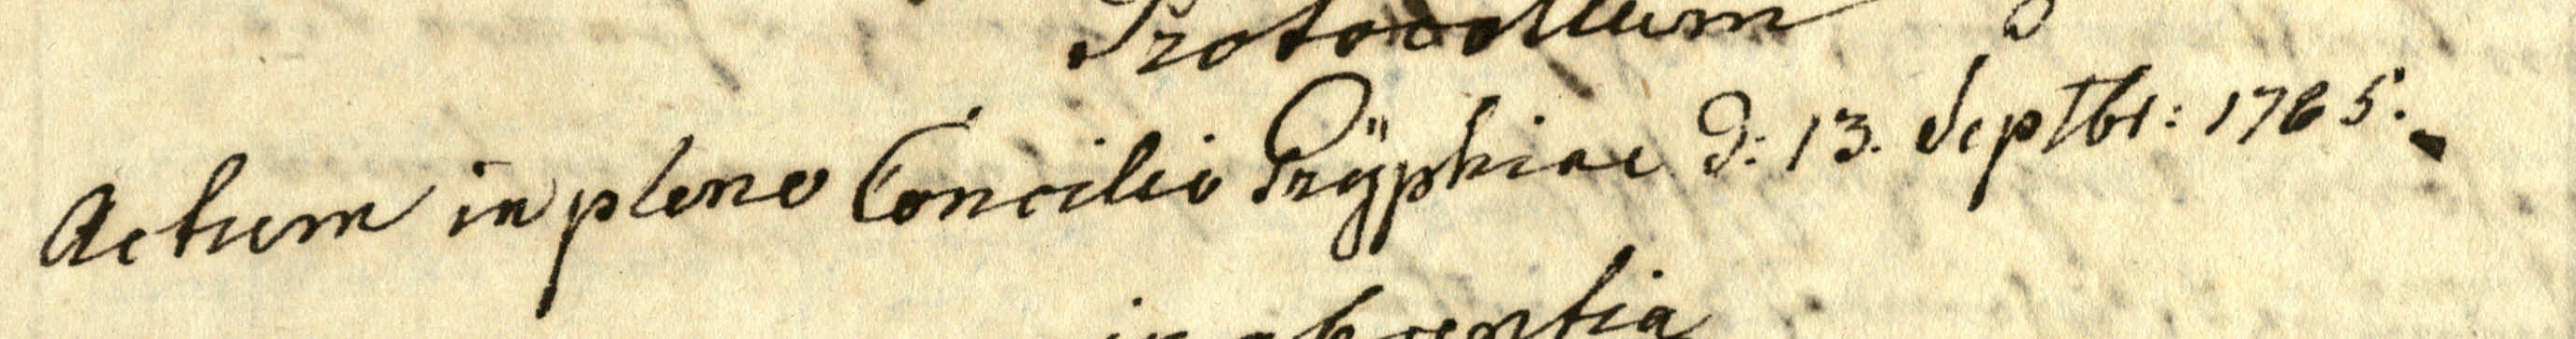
Actum in pleno Concilio Prÿphiae d. 13. S. per. 1785.
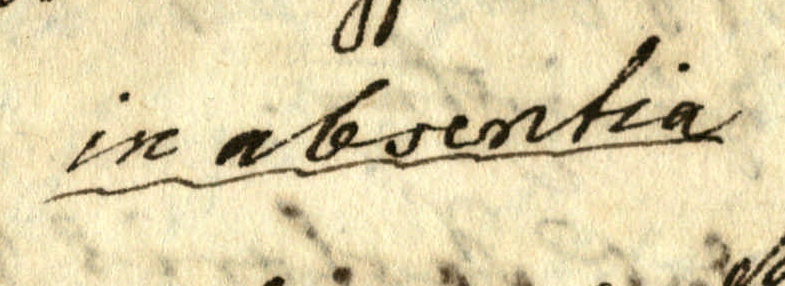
in absentia
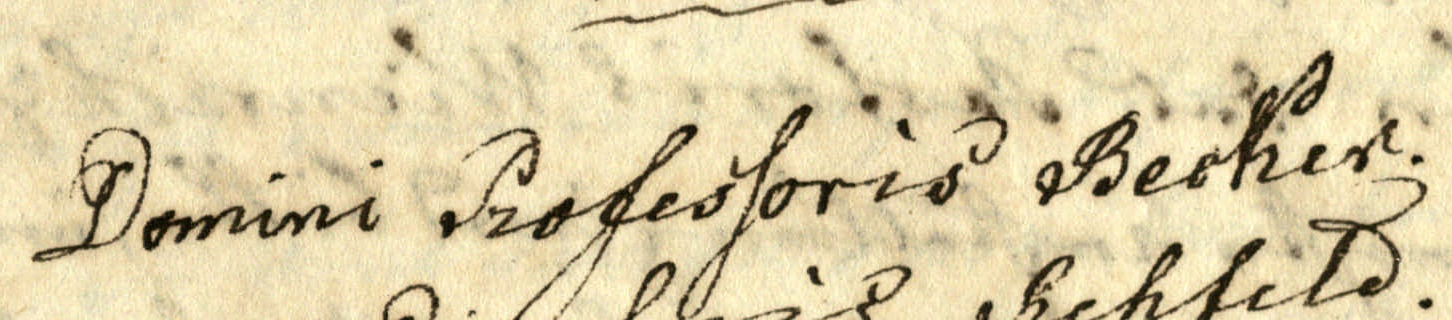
Domini Professoris Becker.
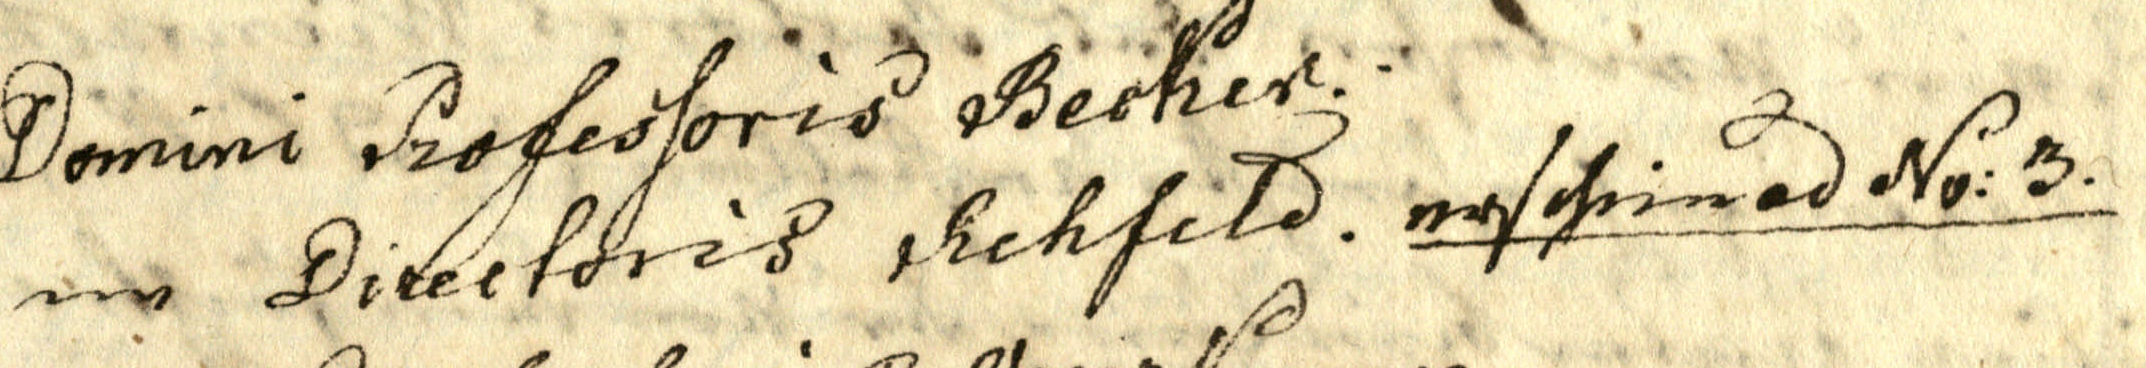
Directoris Rchfild. sein ad der.
